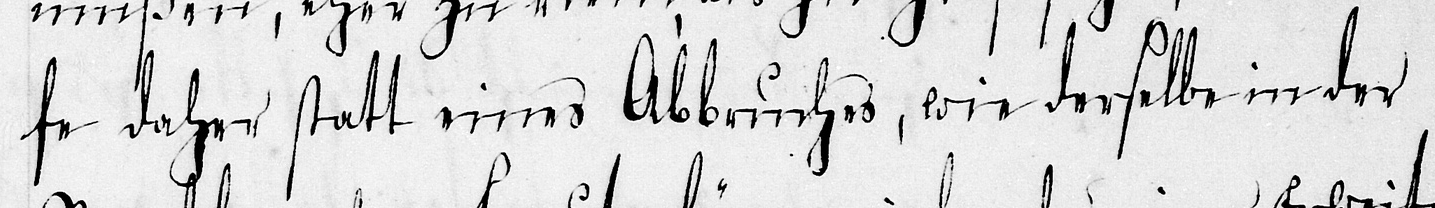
fe daher statt eines Abbruches, wie derselbe in der
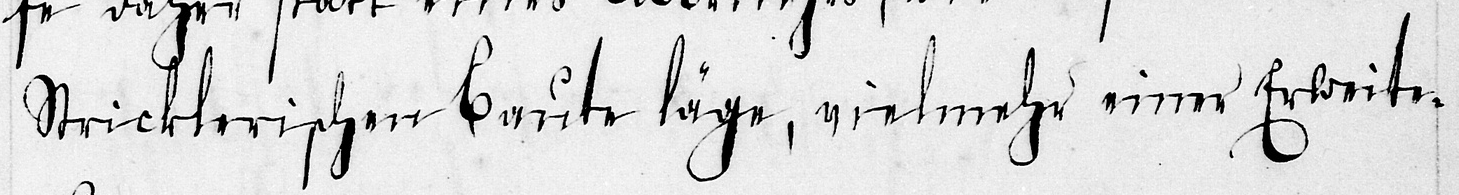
Stricklerischen Baute läge, vielmehr einer Erweite¬
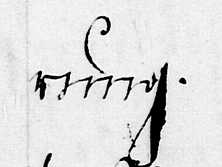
rung.
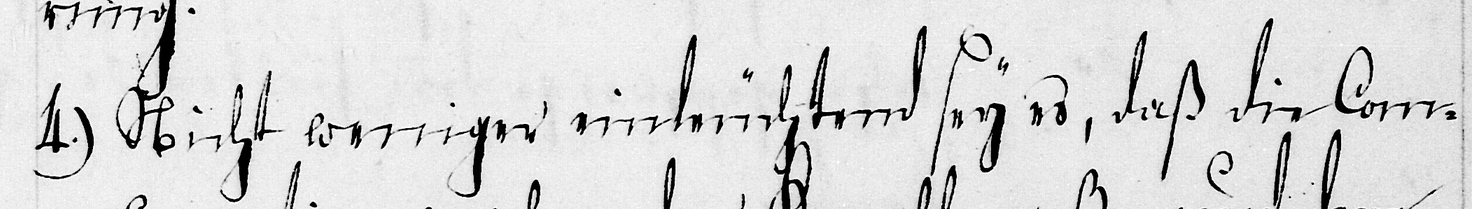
4.) Nicht weniger einleuchtend sey es, daß die Com¬
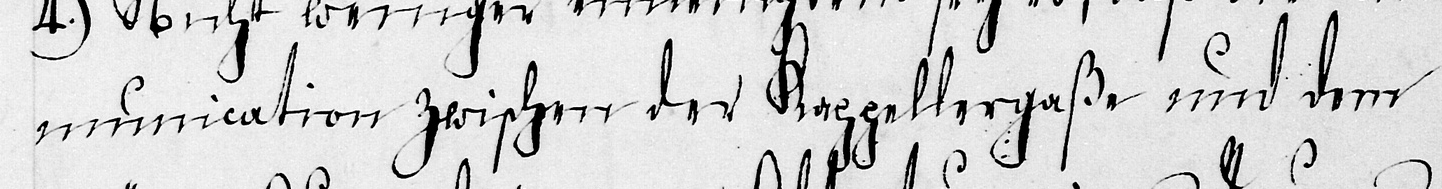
munication zwischen der Kappellergaße und dem
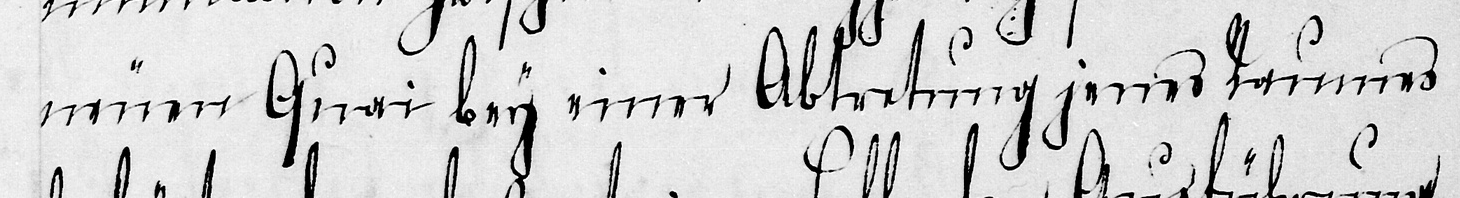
neuen Quai bey einer Abtretung jenes Raumes
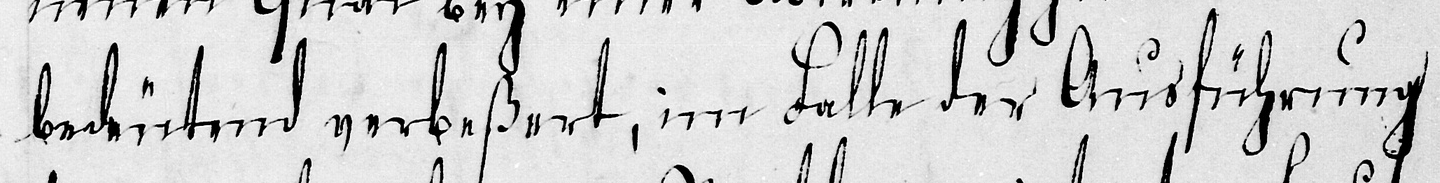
bedeutend verbeßert, im Falle der Ausführung
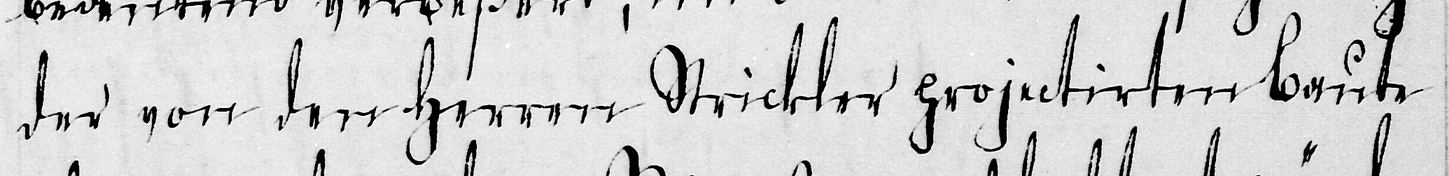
der von den Herren Strickler projectirten Baute
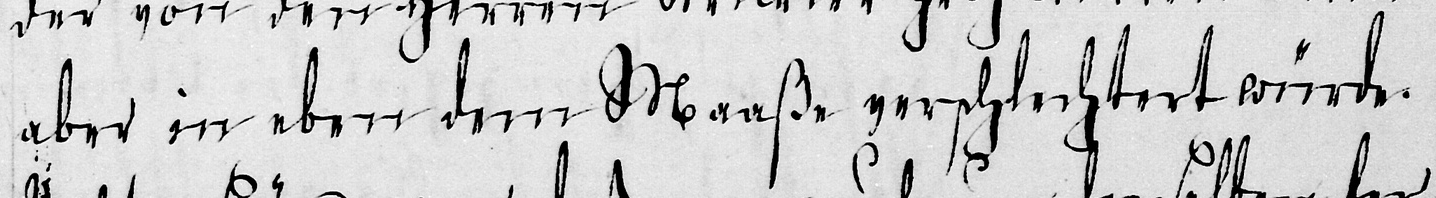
aber in eben dem Maaße verschlechtert würde.
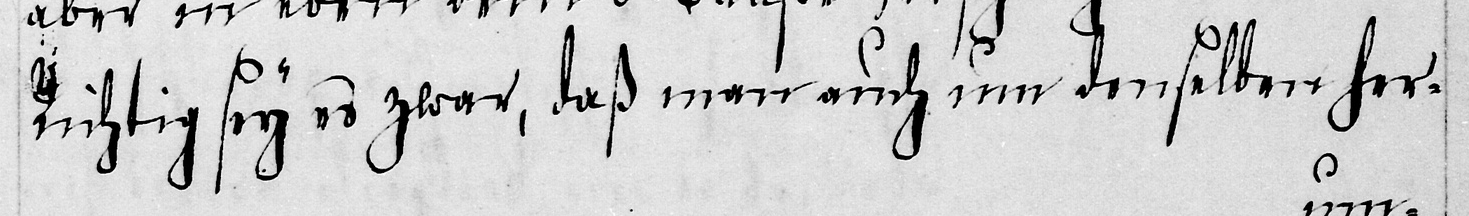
Richtig sey es zwar, daß man auch um denselben her-
